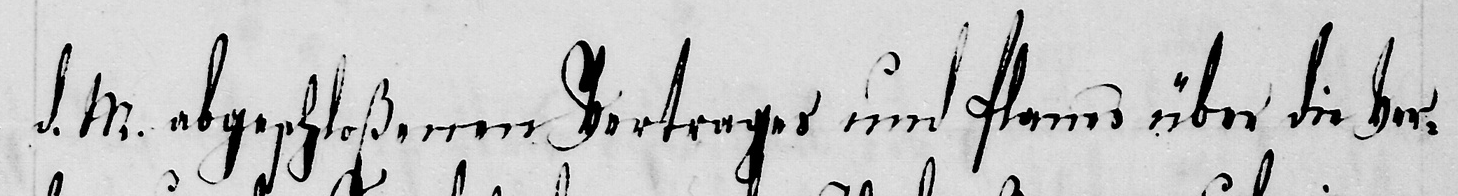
d. M. abgeschloßenen Vertrages und Planes über die Ver¬
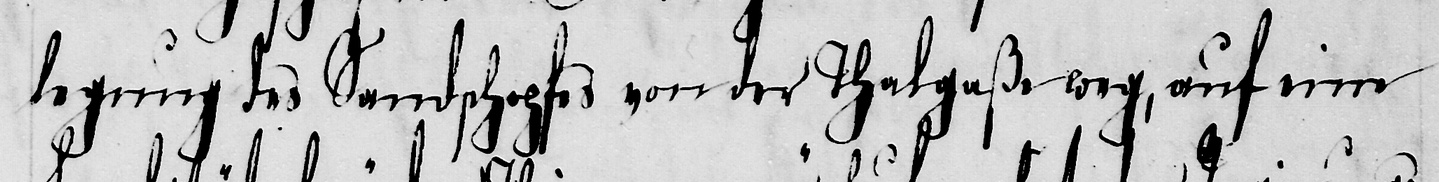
legung des Sandschopfes von der Thalgaße weg, auf eine
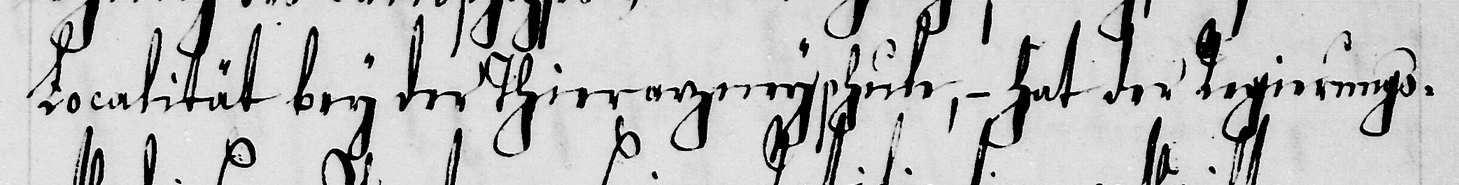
Localität bey der Thierarzneyschule,– hat der Regierungs¬
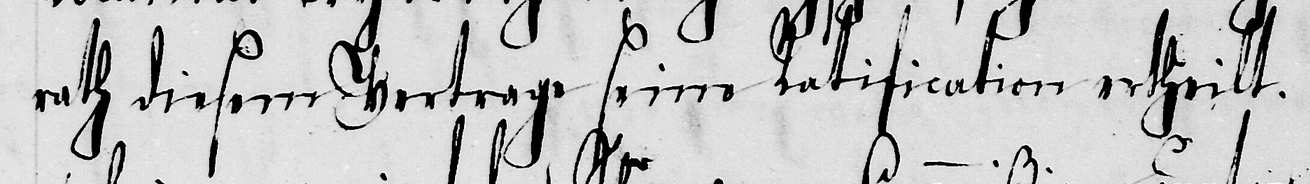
rath diesem Vertrage seine Ratification ertheilt.
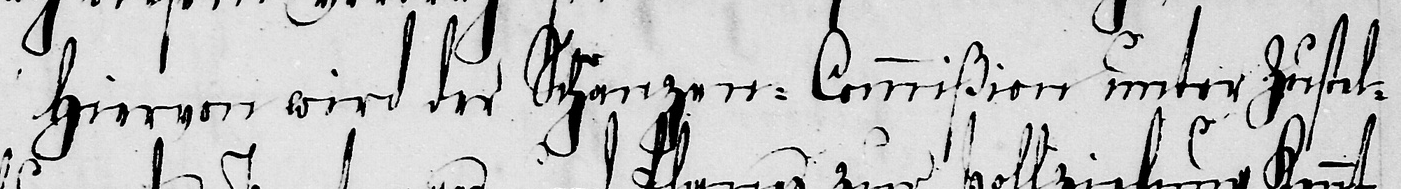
Hiervon wird der Schanzen-Commißion unter Zustel¬
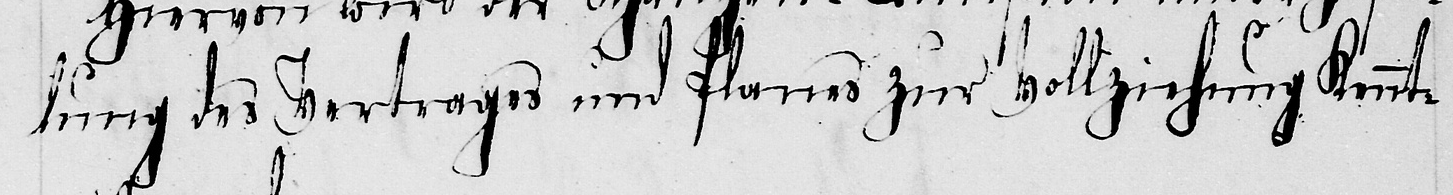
lung des Vertrages und Planes zur Vollziehung Kennt¬
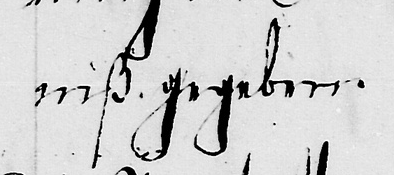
niß gegeben.
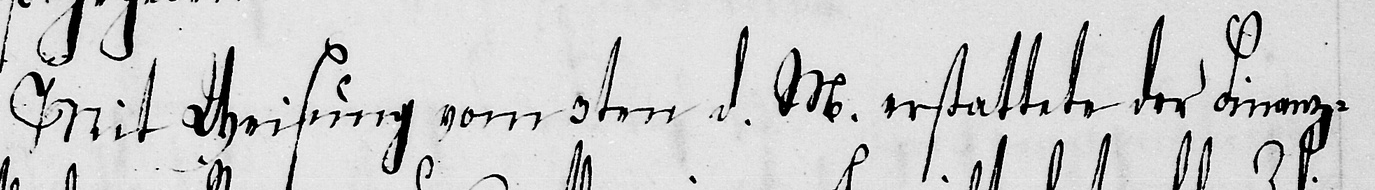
Mit Weisung vom 3ten d. M. erstattete der Finanz¬
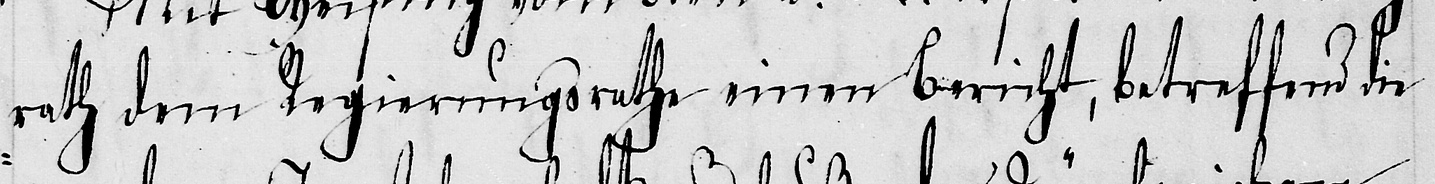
rath dem Regierungsrathe einen Bericht, betreffend die
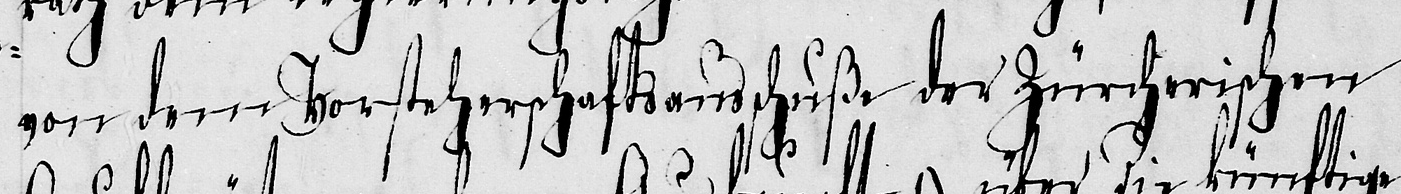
von dem Vorsteherschaftsausschuße der Zürcherischen
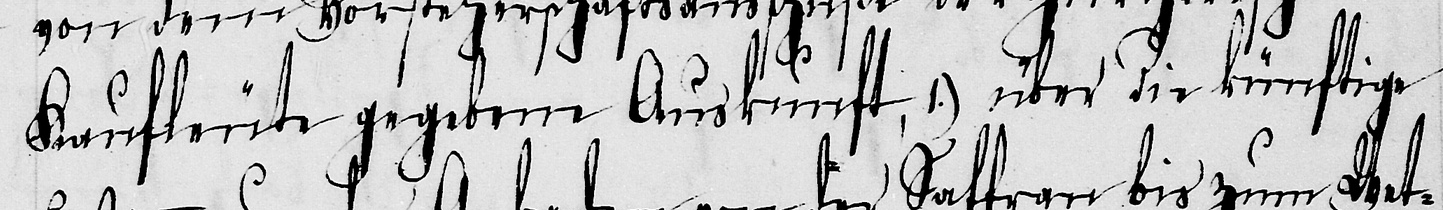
Kaufleute gegebene Auskunft, 1.) über die künftige
